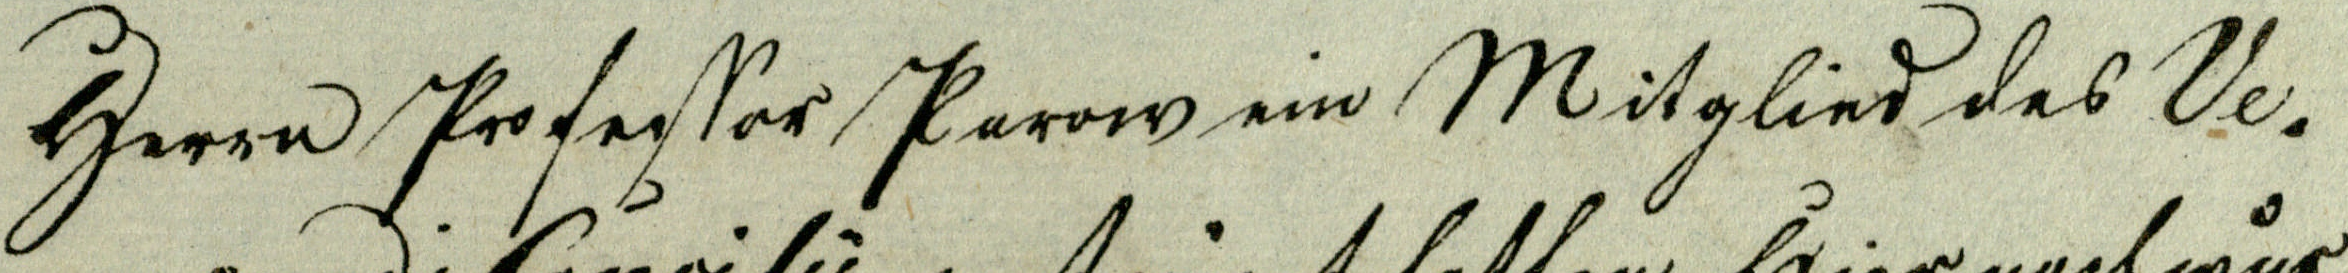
Herrn Professor Parow ein Mitglied des Ve¬
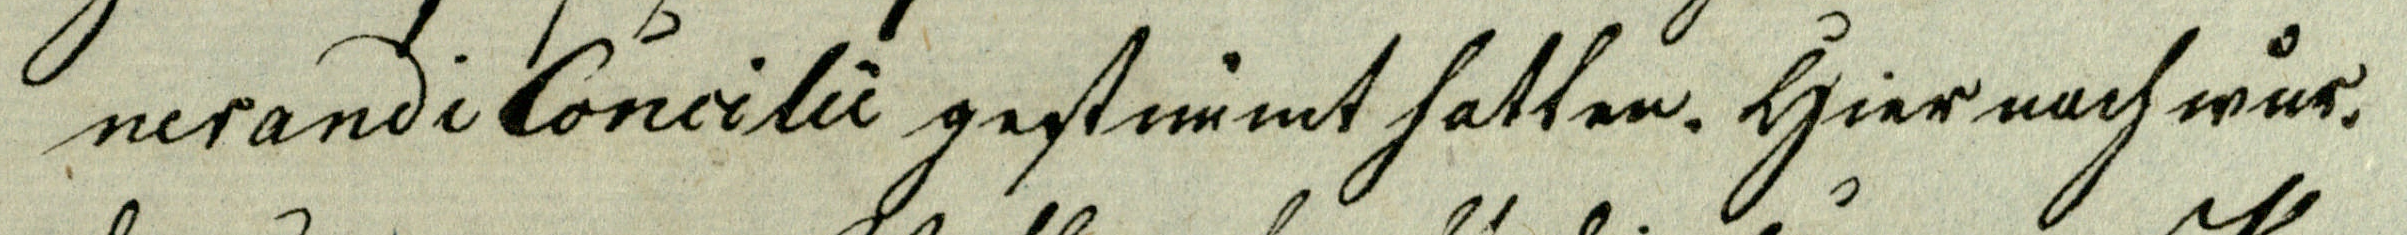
nerandi Concilii gestimmt hatten. Hiernach wur¬
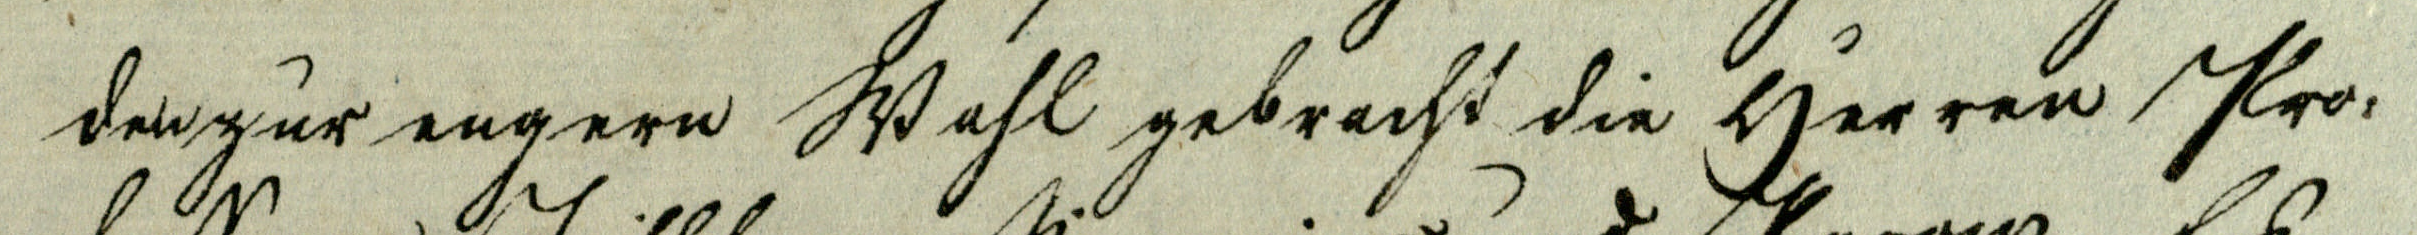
den zur engern Wahl gebracht die Herren Pro¬
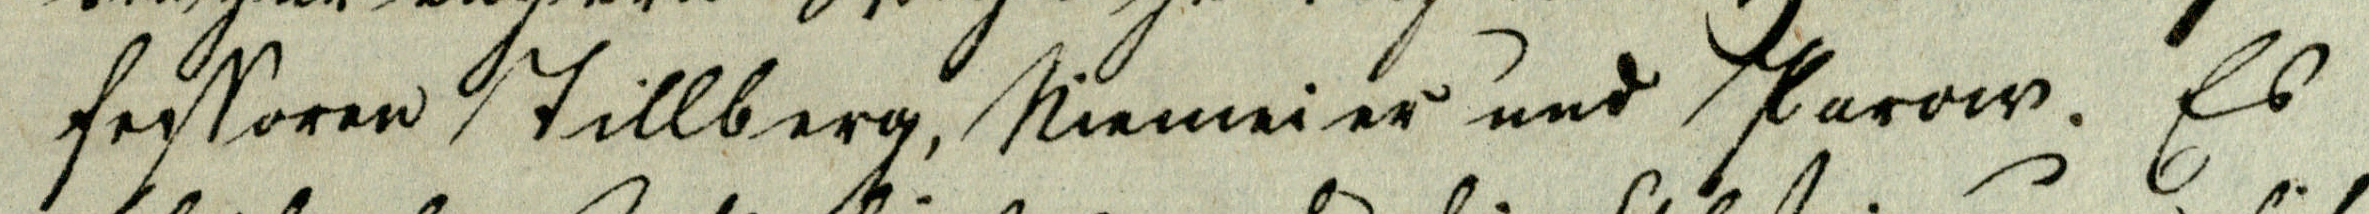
fessoren Tillberg, Niemeier und Parow. Es
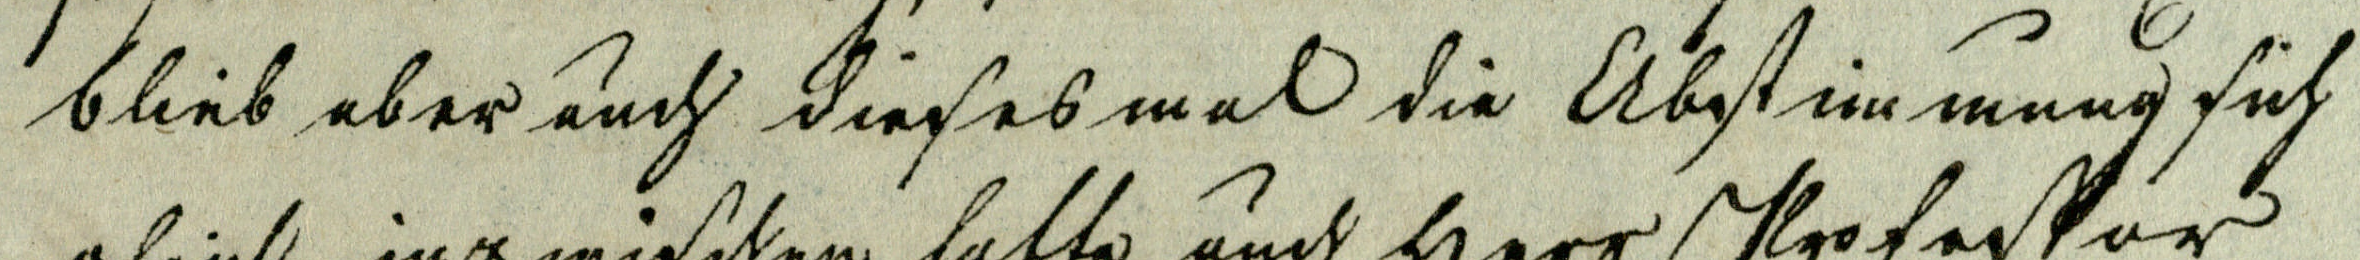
blieb aber auch diesesmal die Abstimmung sich
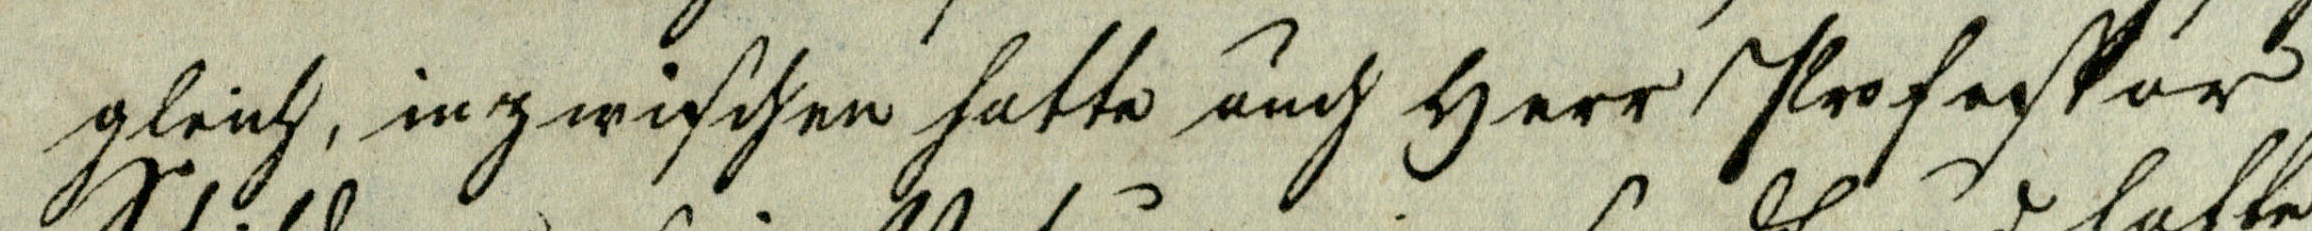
gleich, inzwischen hatte auch Herr Professor
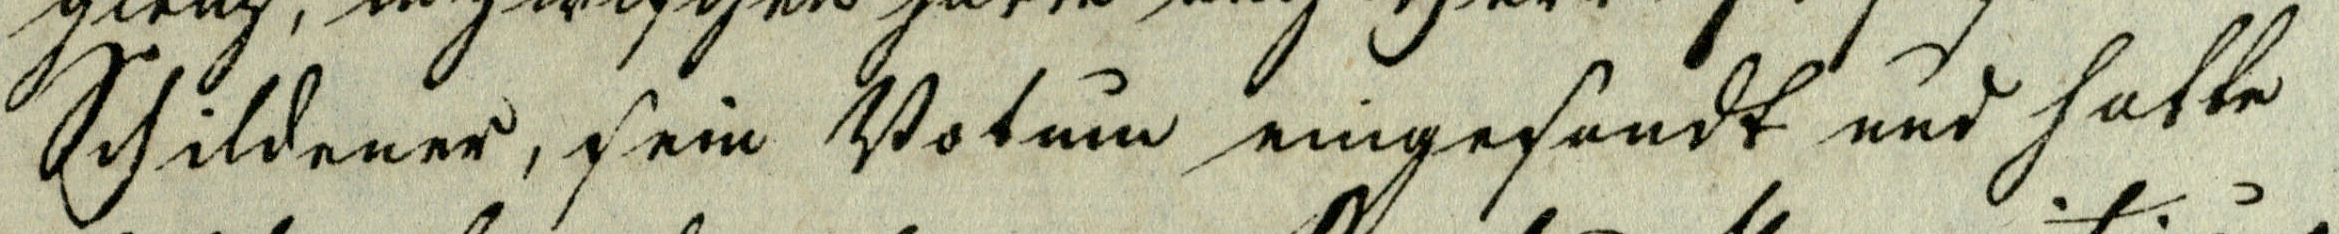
Schildener, sein Votum eingesandt und hatte
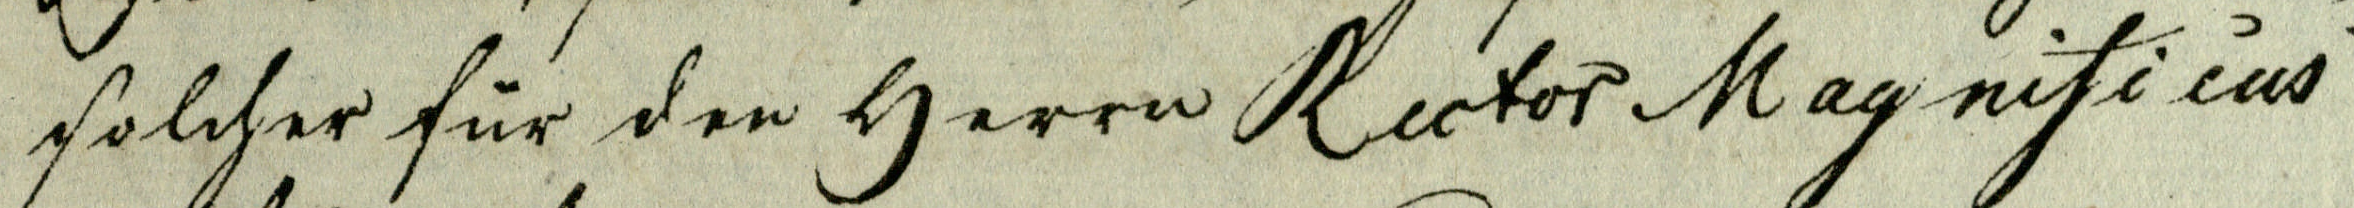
solcher für den Herrn Rector Magnificus
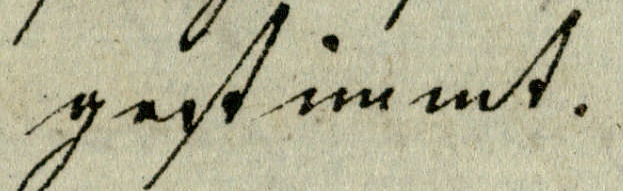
gestimmt.
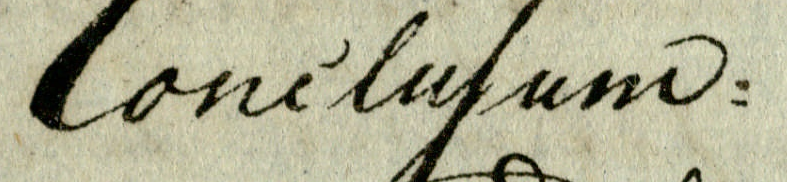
Conclusum:
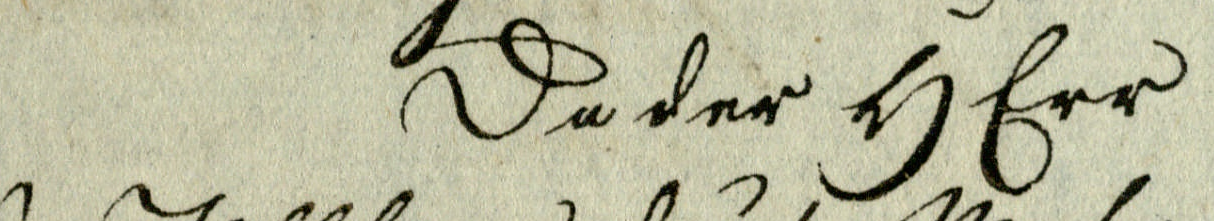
Da der HErr
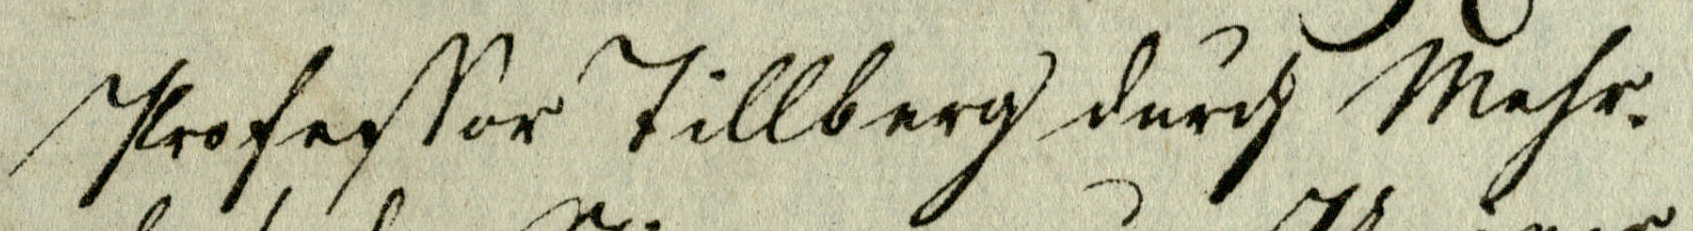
Professor Tillberg durch Mehr¬
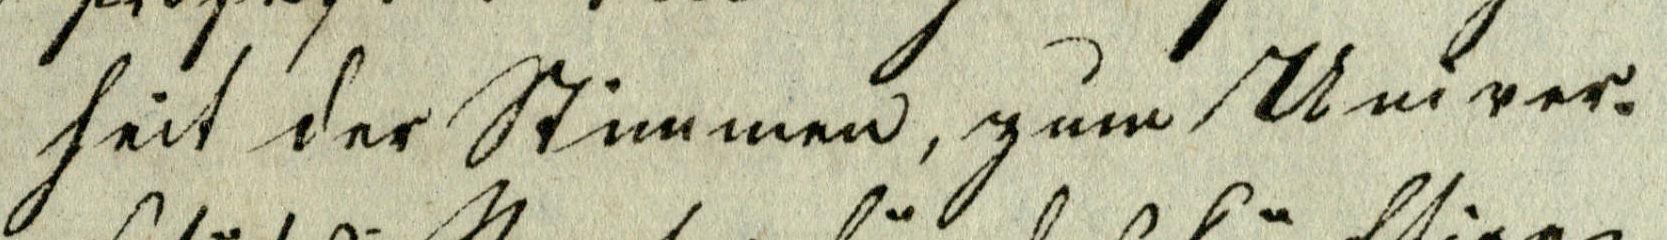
heit der Stimmen, zum Univer—
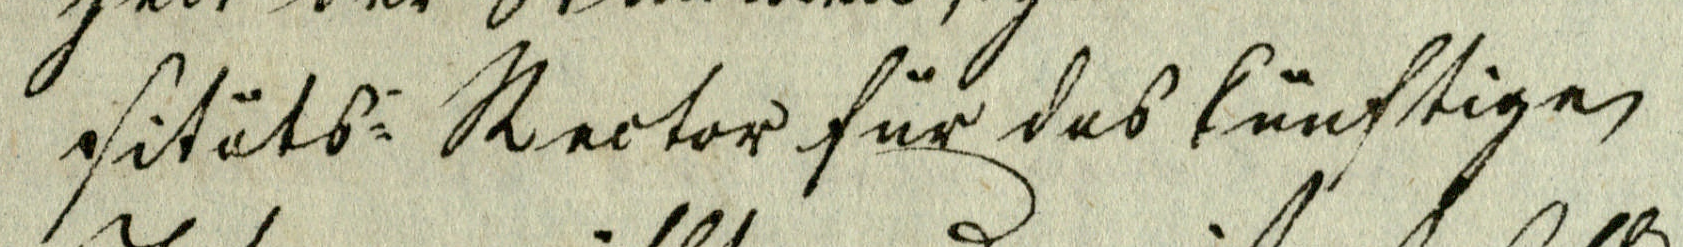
sitäts Rector für das künftige,
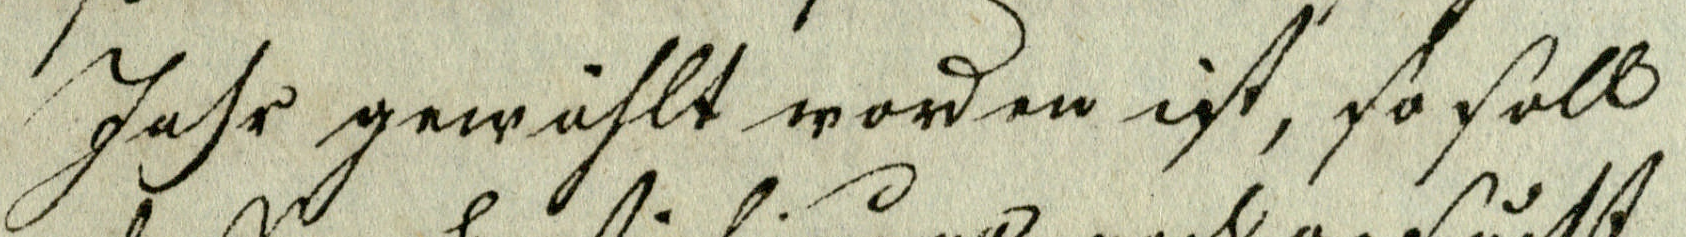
Jahr gewählt worden ist, so soll
